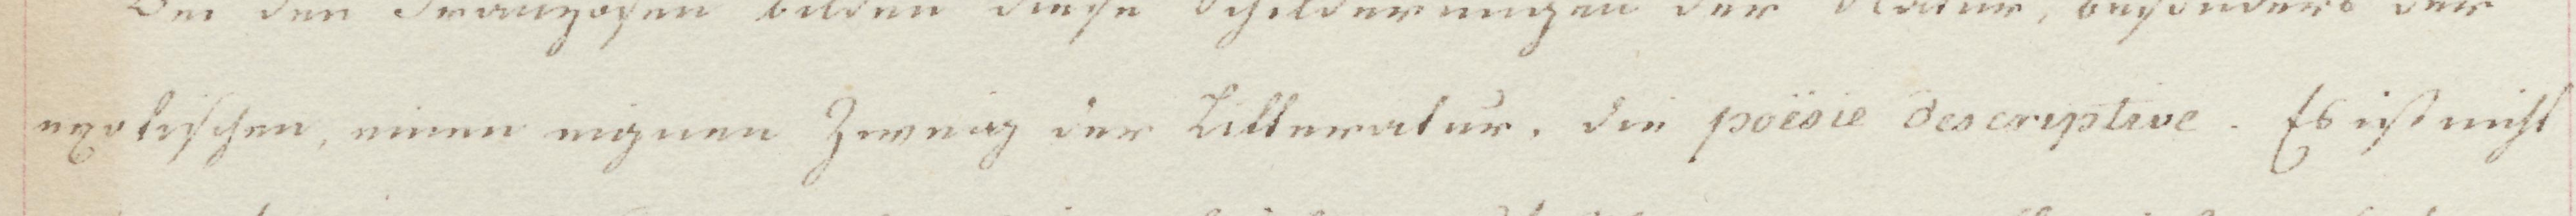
exotischen, einen eignen Zweig der Litteratur, die poësie descriptive. Es ist nicht
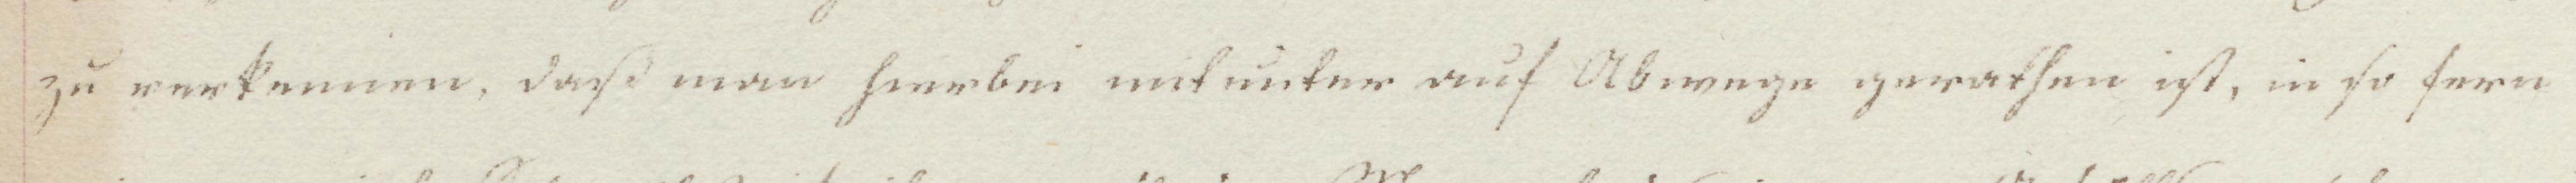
zu verkennen, daß man hierbei mitunter auf Abwege gerathen ist, in so fern
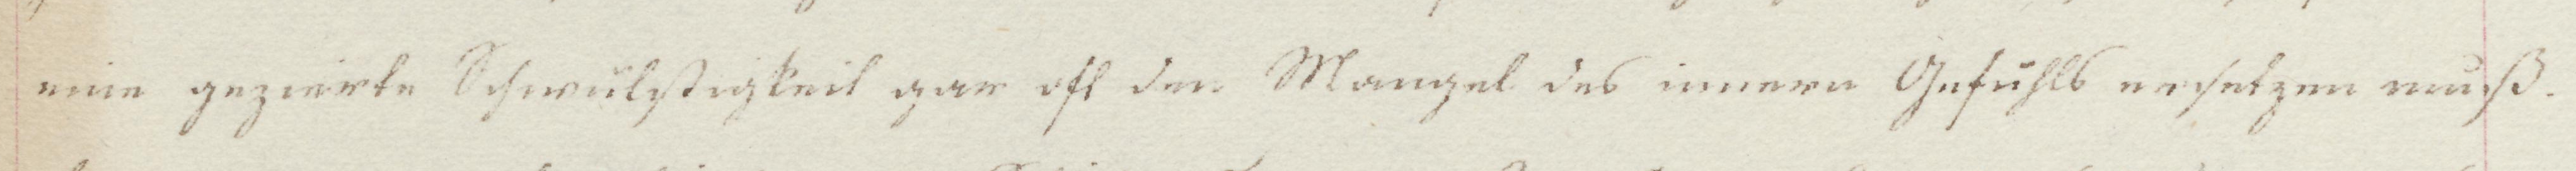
eine gezierte Schwülstigkeit gar oft den Mangel des innern Gefühls ersetzen muß.
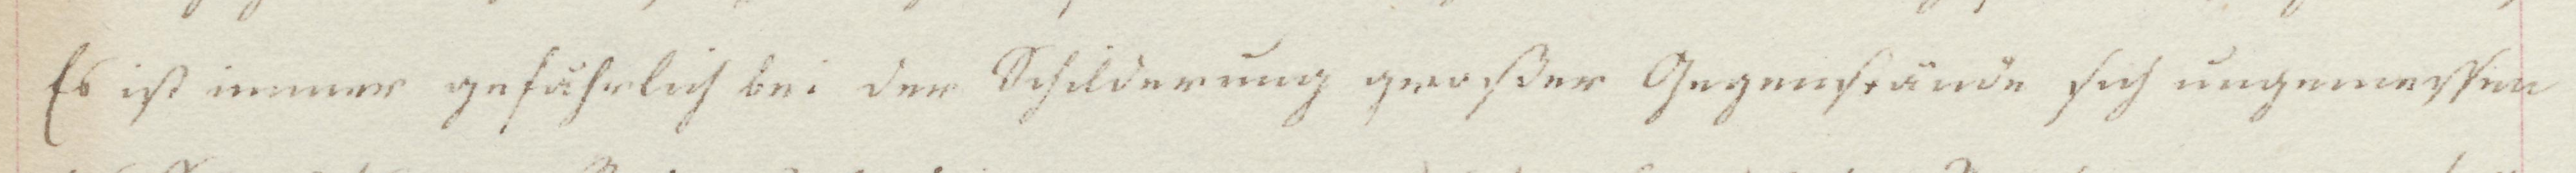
Es ist immer gefährlich bei der Schilderung großer Gegenstände sich ungemessen
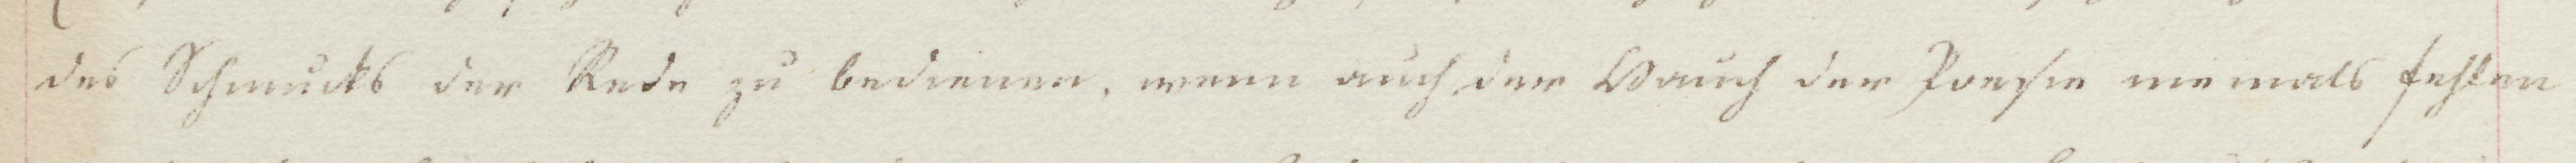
des Schmucks der Rede zu bedienen, wenn auch der Hauch der Poesie niemals fehlen
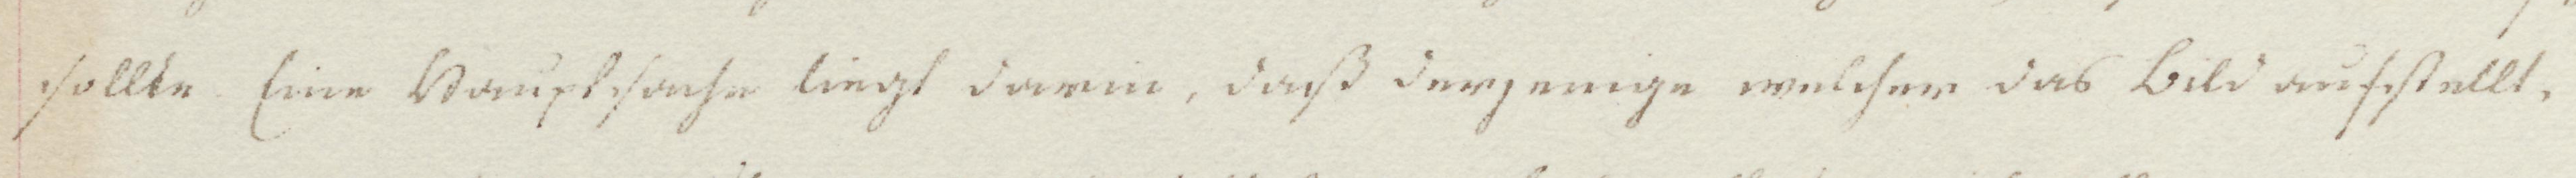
sollte. Eine Hauptsache liegt darin, daß derjenige welcher das Bild aufstellt,
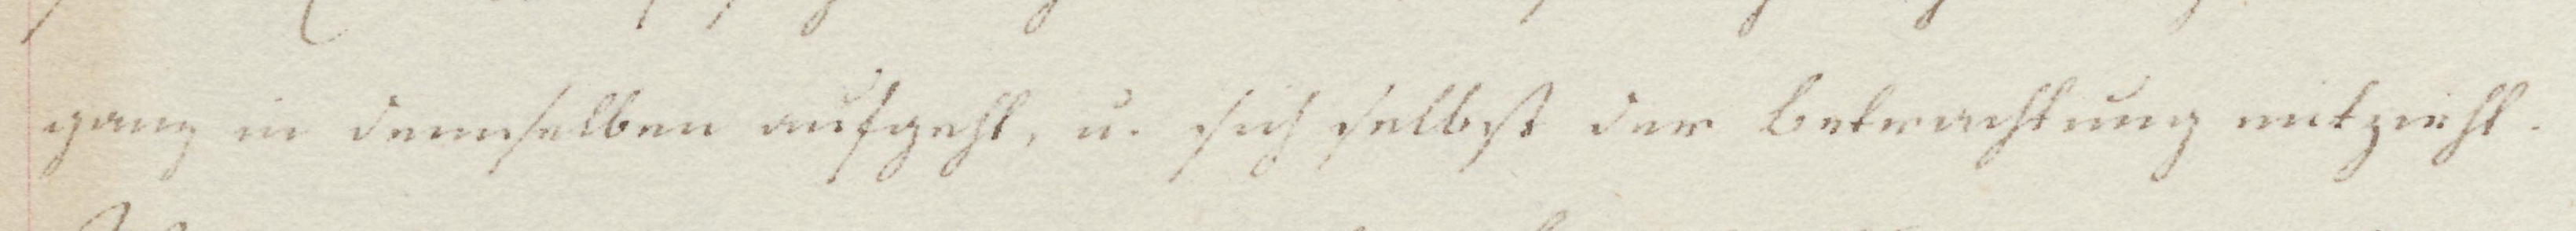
ganz in demselben aufgeht, u. sich selbst der Betrachtung mitzieht.
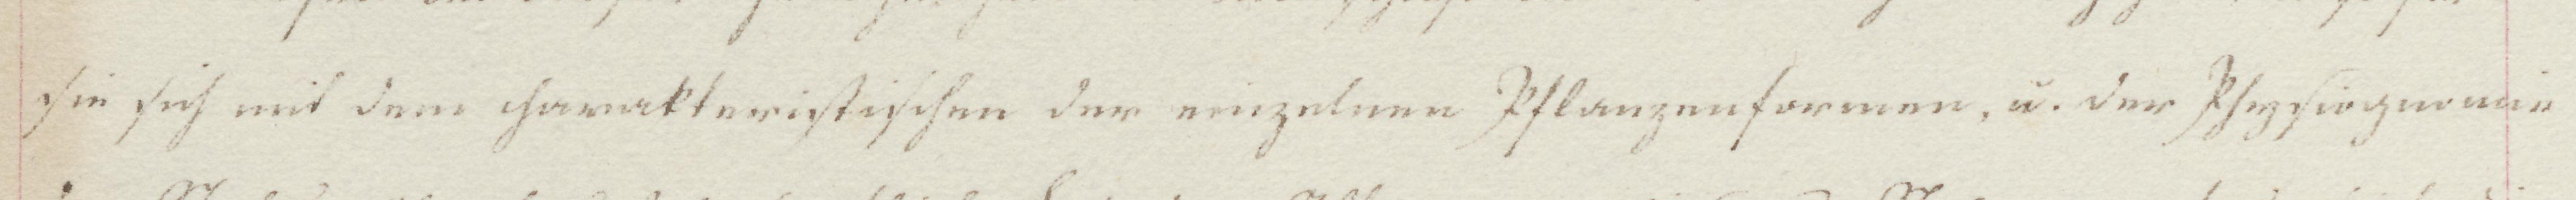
sie sich mit dem charakteristischen der einzelnen Pflanzenformen, u. der Physiognomie
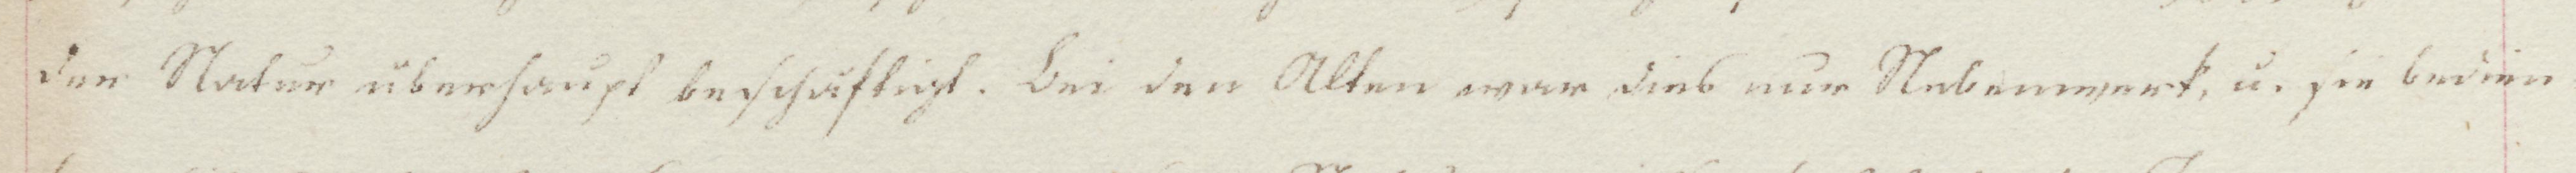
der Natur überhaupt beschäftigt. Bei den Alten war dies nur Nebenwerk, u. sie bedien-
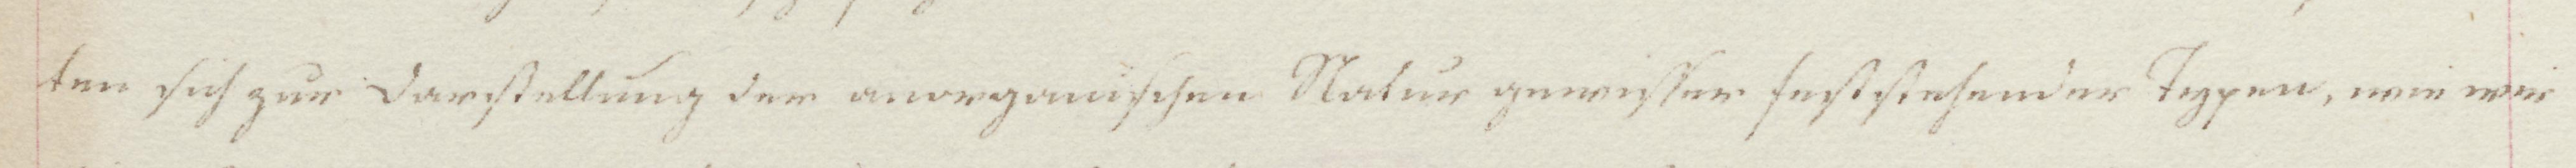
ten sich zur Darstellung der anorganischen Natur gewisser feststehender Typen, wie wir
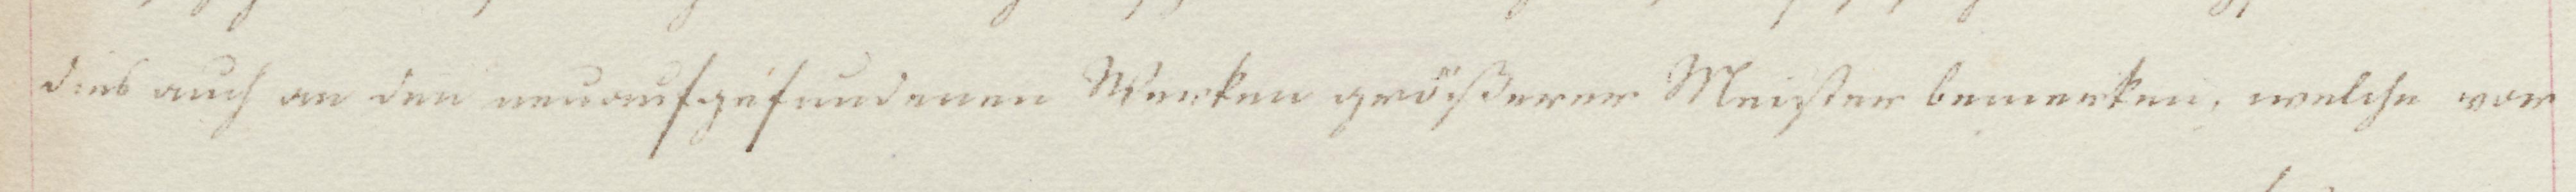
dies auch an den neuaufgefundenen Werken größerer Meister bemerken, welche vor
